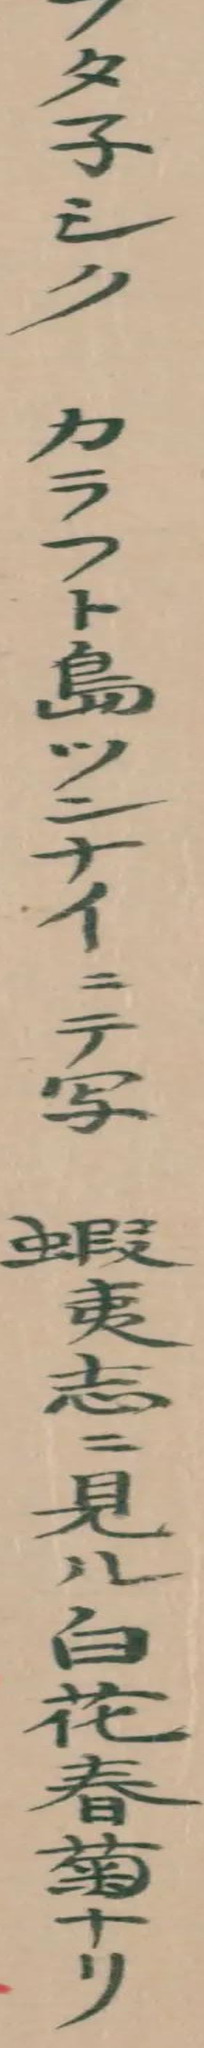ヲタネシクカラフト島ツンナイニテ写蝦夷志ニ見ル白花春菊ナリ
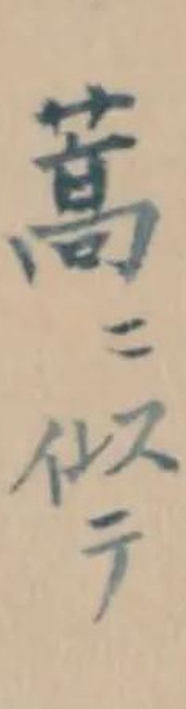蒿ニ似テ

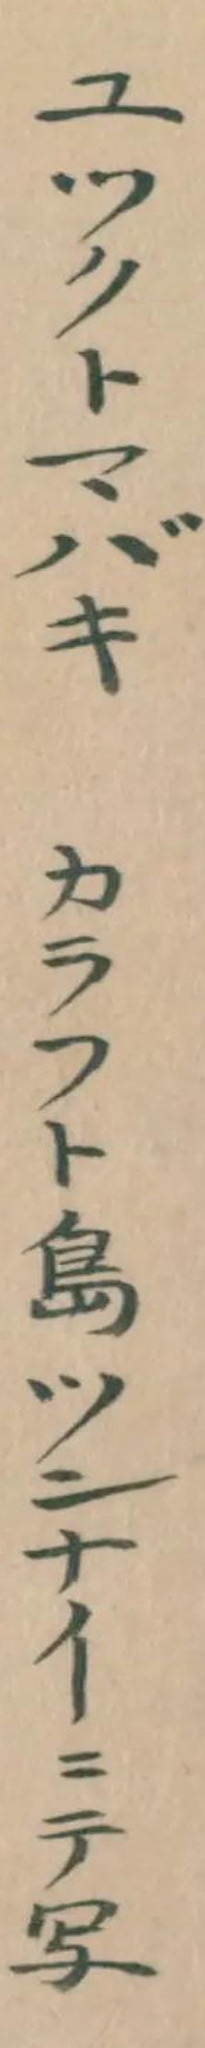ユツクトマバキカラフト島ツンナイニテ写ス
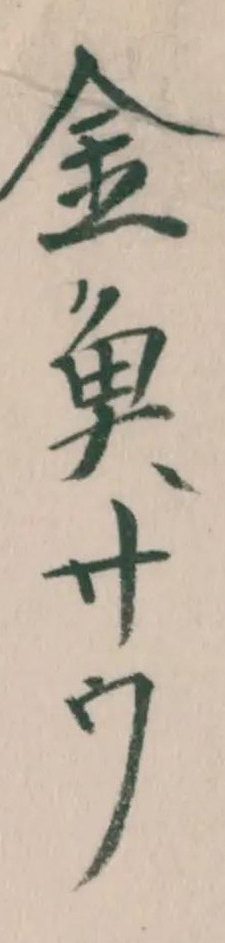金魚サウ
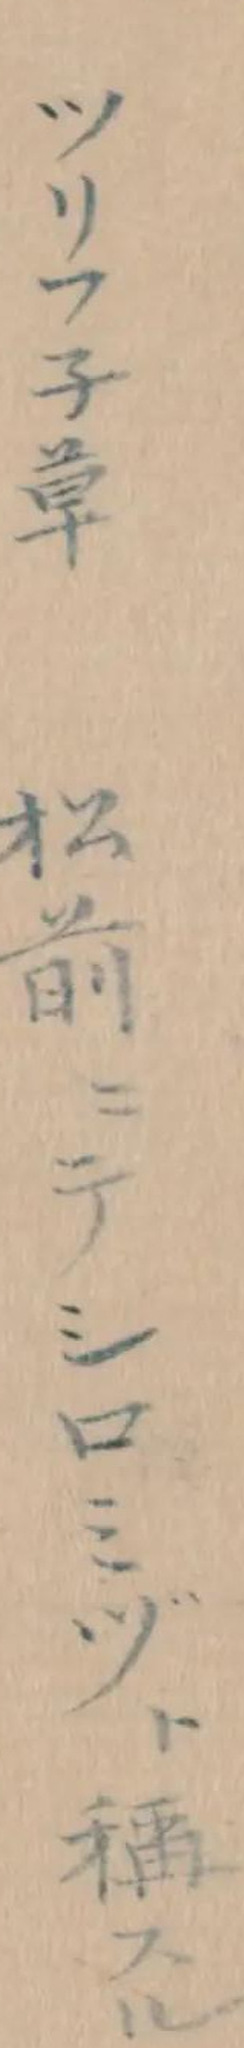ツリフ子草松前ニテシロミツト称スル
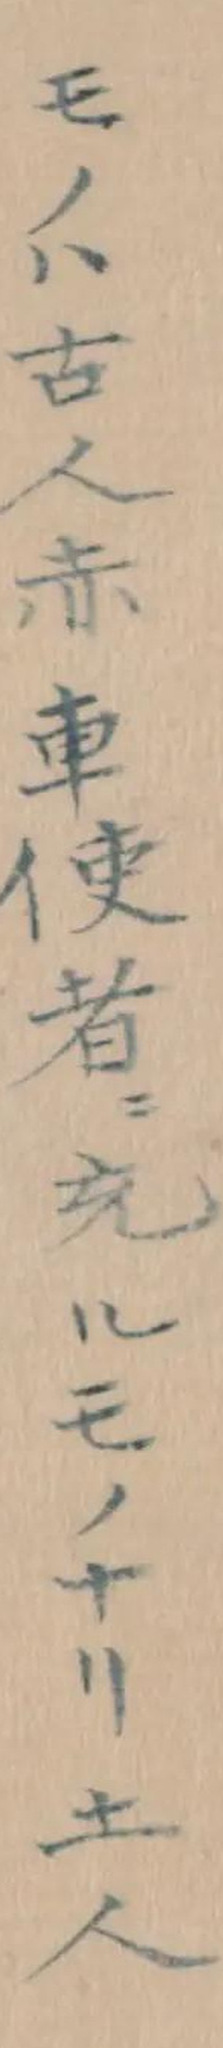モノハ古人赤車使者ニ充ルモノナリ土人
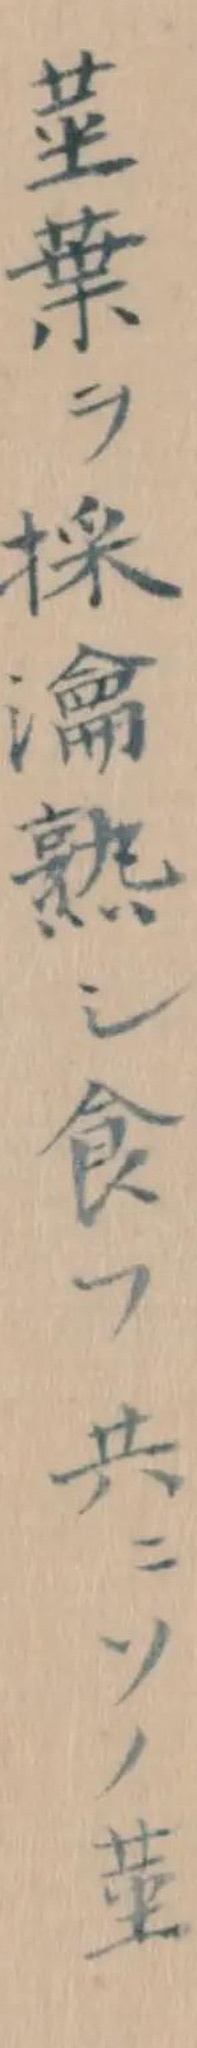茎葉ヲ採瀹熟シ食フ共ニソノ茎
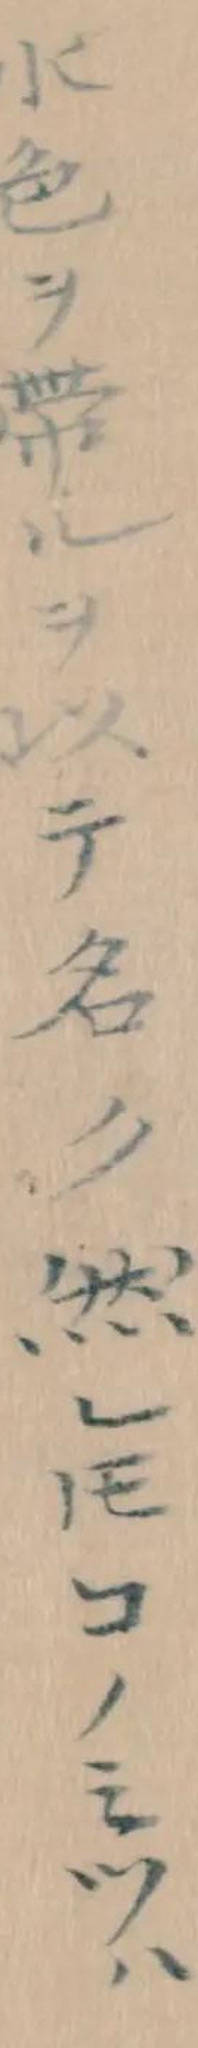水色ヲ帯ルヲ以テ名ク然レトモコノミツハ
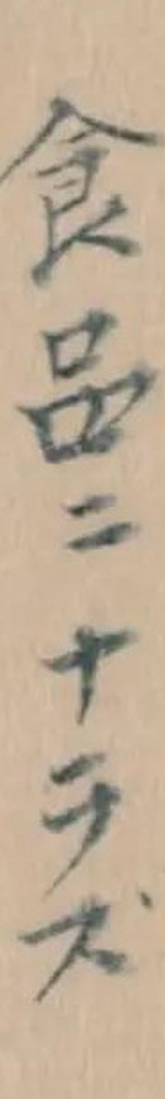食品ニナラズ
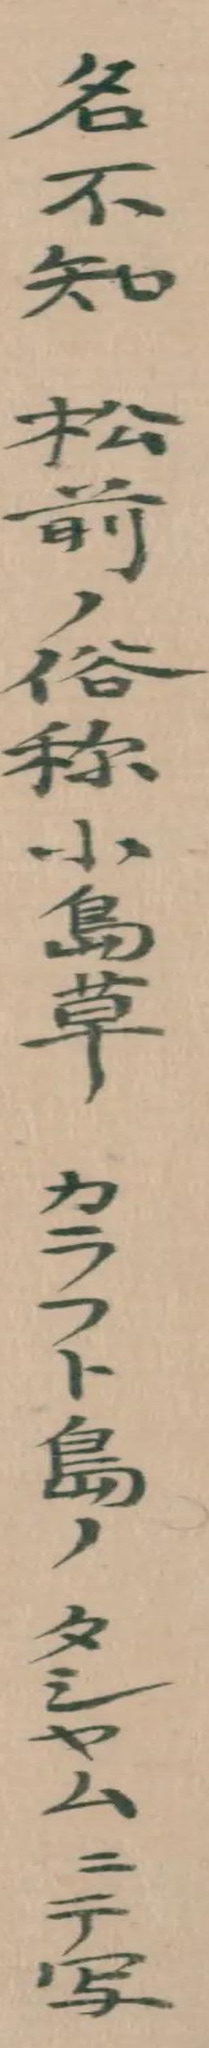名不知松前ノ俗称小島草カラフト島ノタシヤムニテ写
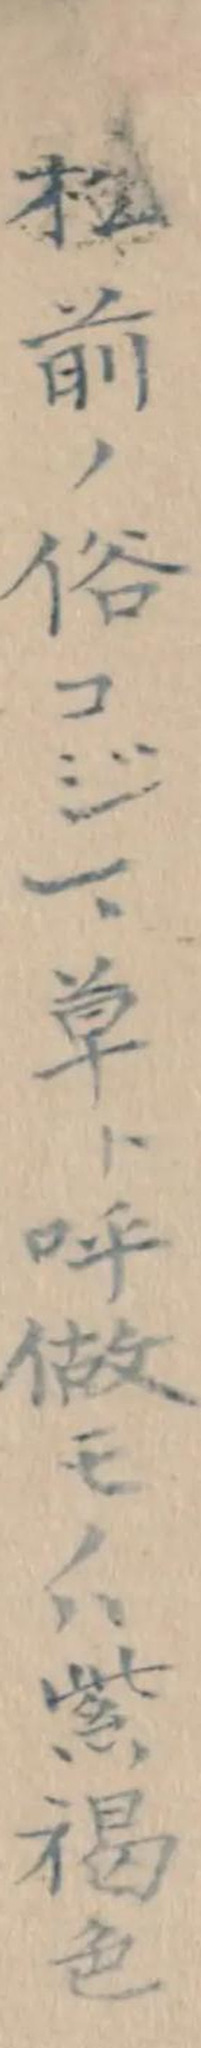松前ノ俗コジマ草ト呼做モノハ紫褐色
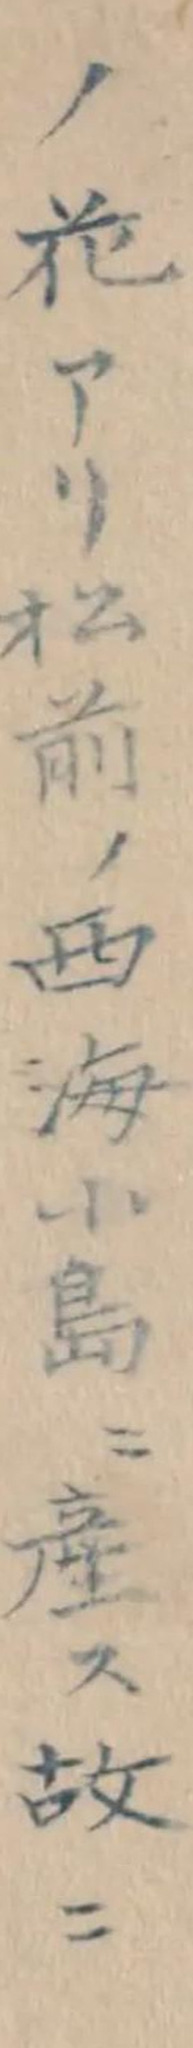ノ花アリ松前ノ西海小島ニ産ス故ニ
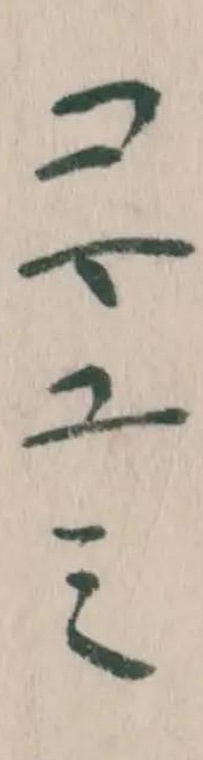コマユミ

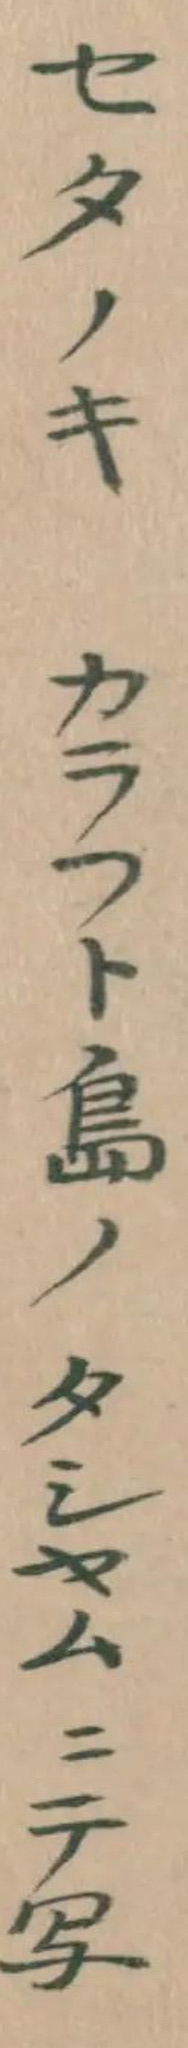セタノキカラフト島ノタシヤムニテ写
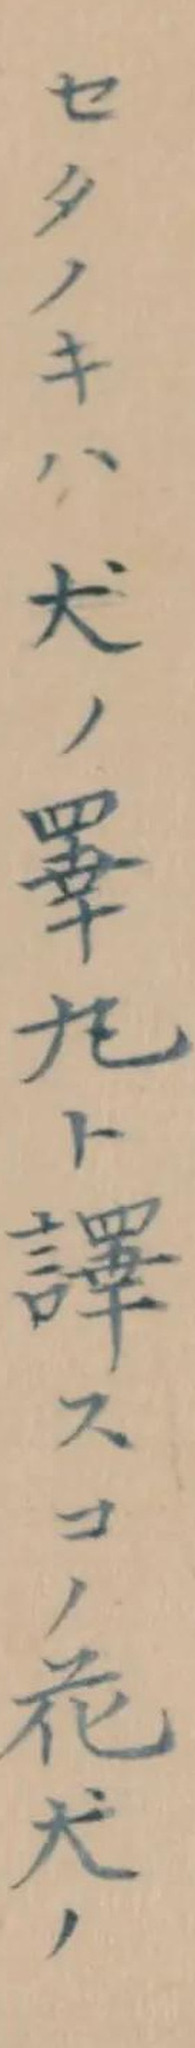セタノキハ犬ノ睾丸ト訳スコノ花犬ノ
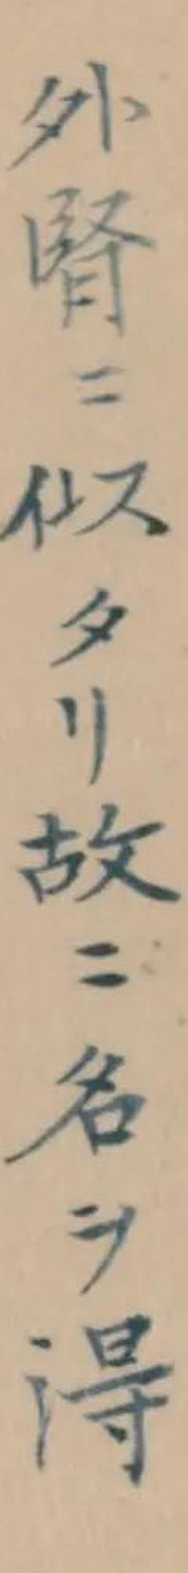外腎ニ似タリ故ニ名ヲ得
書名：蝦夷草木図
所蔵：国立国会図書館 National Diet Library, JAPAN
